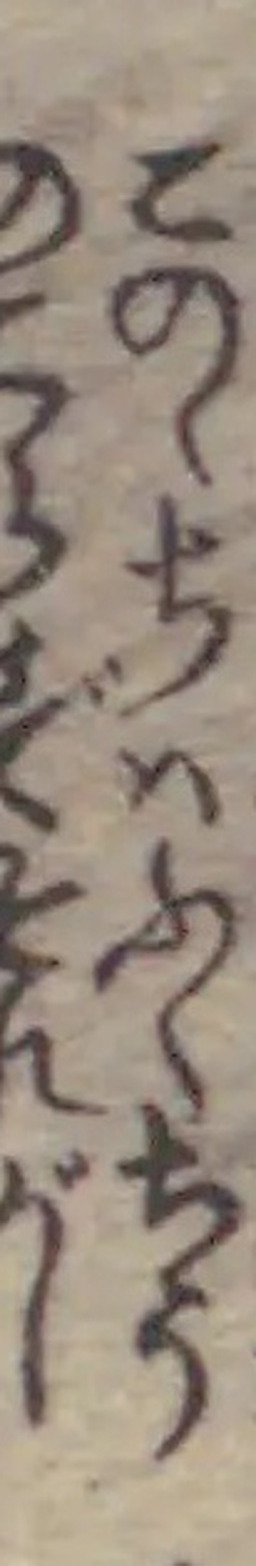のこらずそれがし
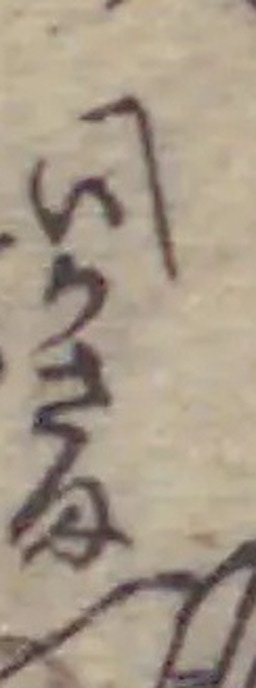〽いかさま
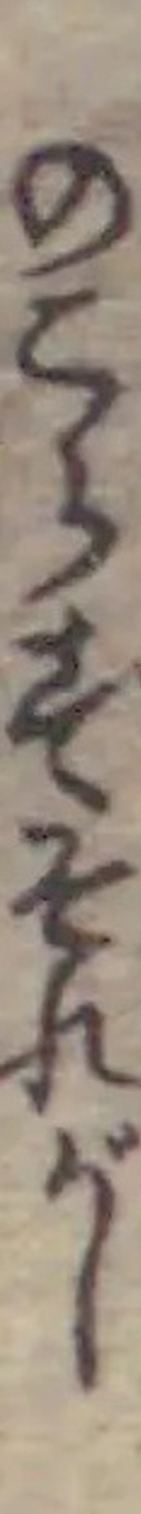のこらずそれがし
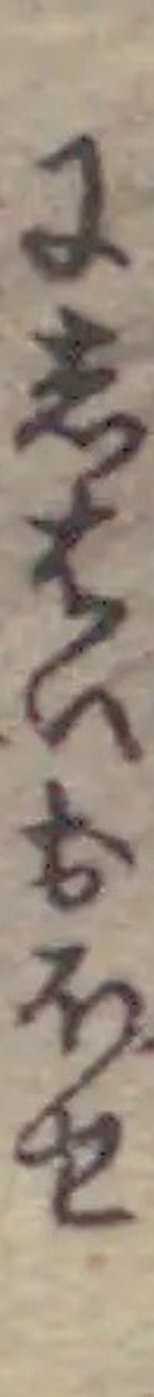にしはいおほせ
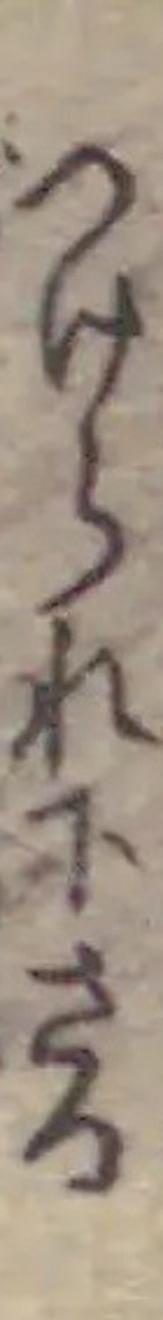つけられ下さる
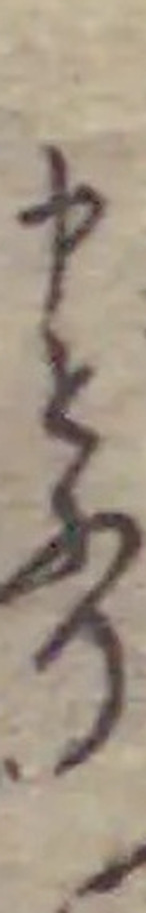申とふり
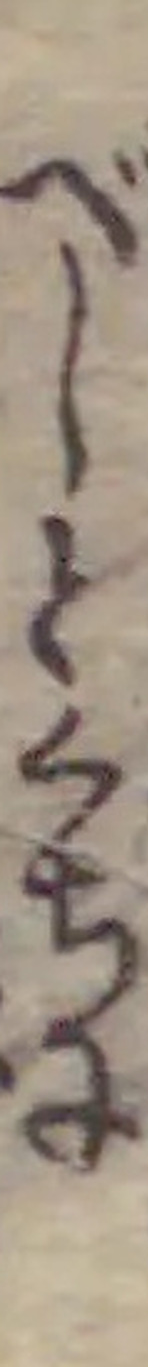べしとくちに
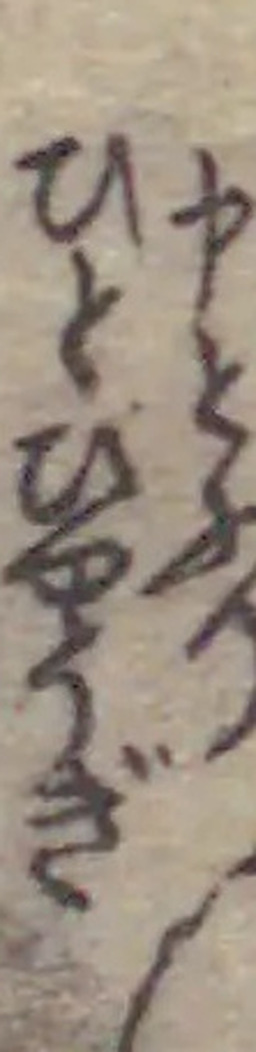ひとひやうぎ
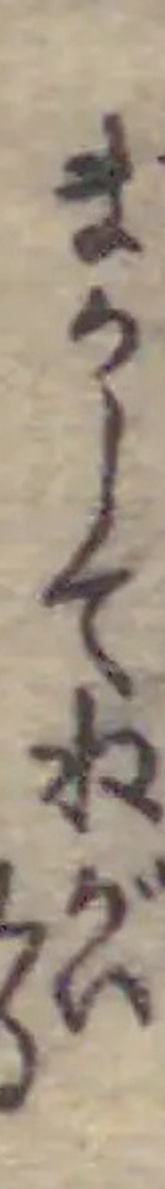まかしてねがい
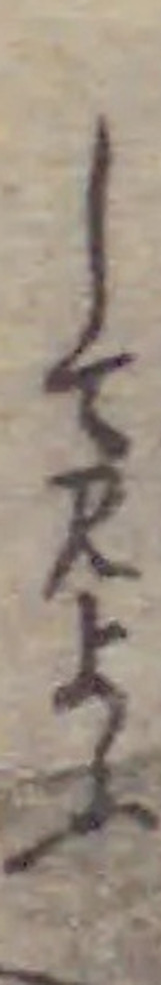してみよふ

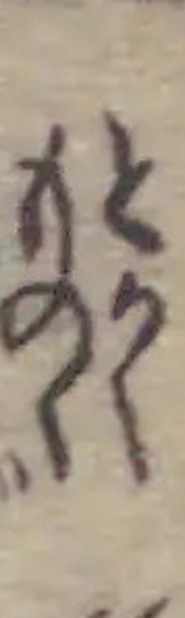ものゝ
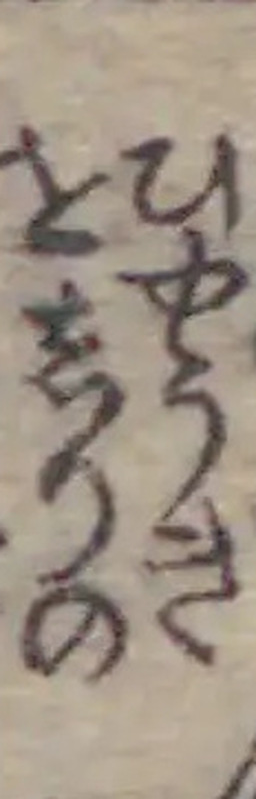をしりの
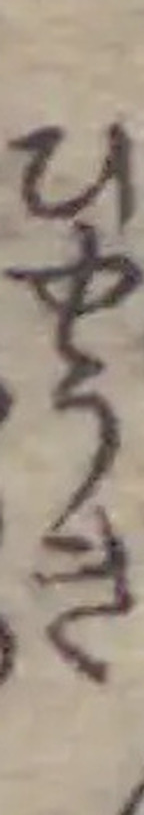ひやうぎ
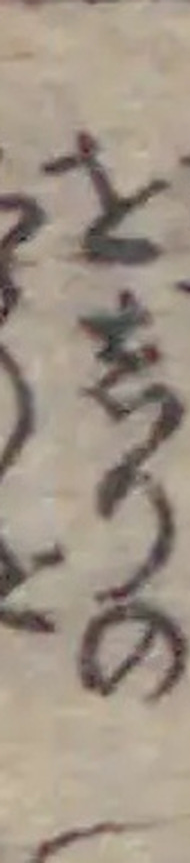をしりの
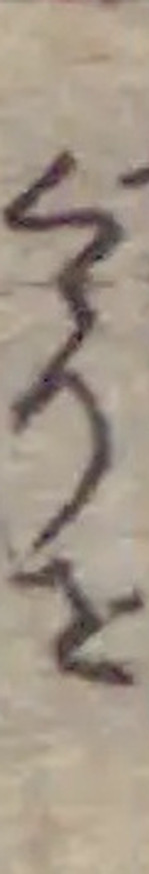くゝりを
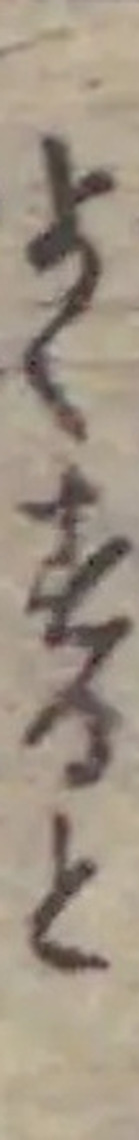よくすると
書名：腹内養生主論 3巻
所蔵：国立国会図書館 National Diet Library, JAPAN
